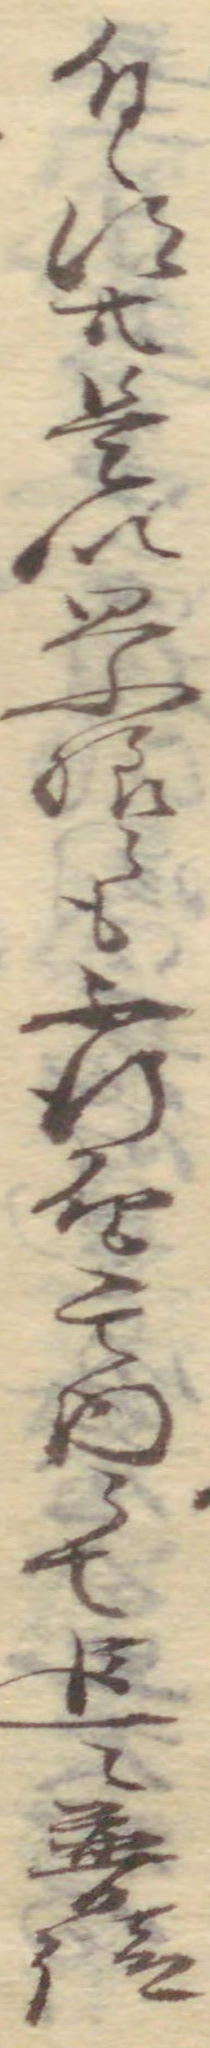付候得共是以思ふ様ニも不行届其内ニは追々普請
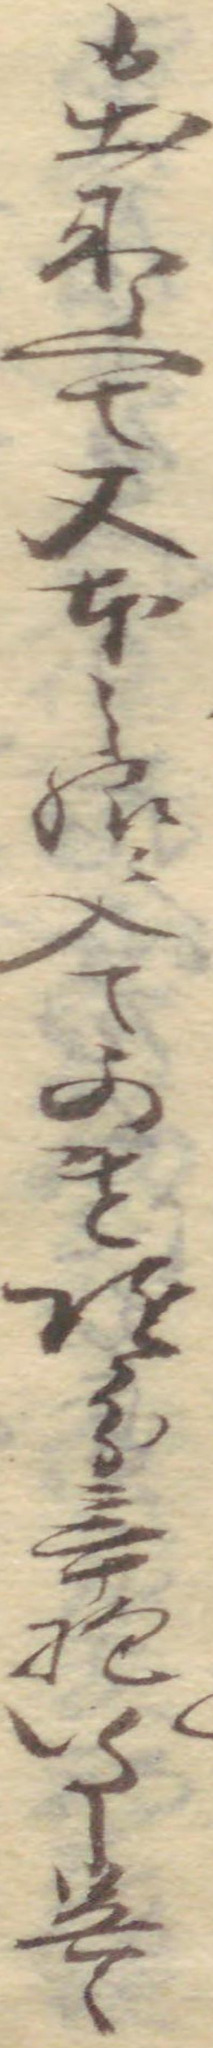も出来候へは又本之様ニ入て可遣随分辛抱いたし呉候
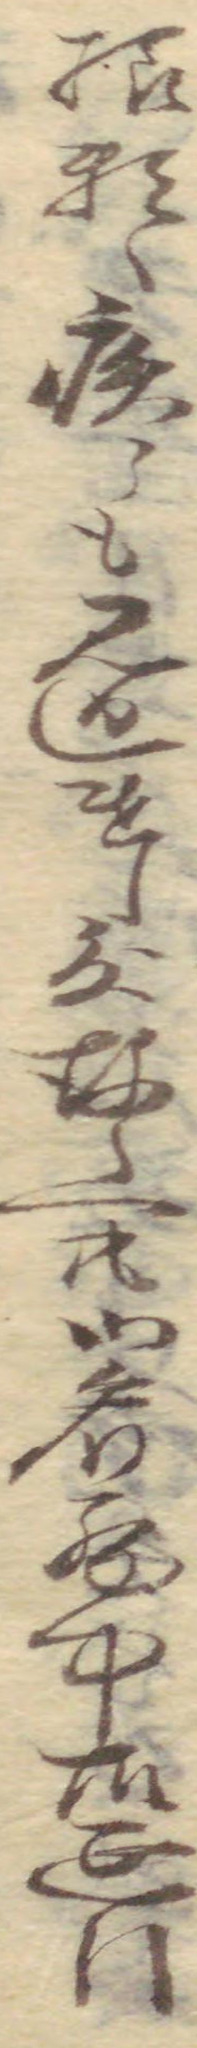様頼候疾ニも見廻遣し度存候へ共御看病中故延引
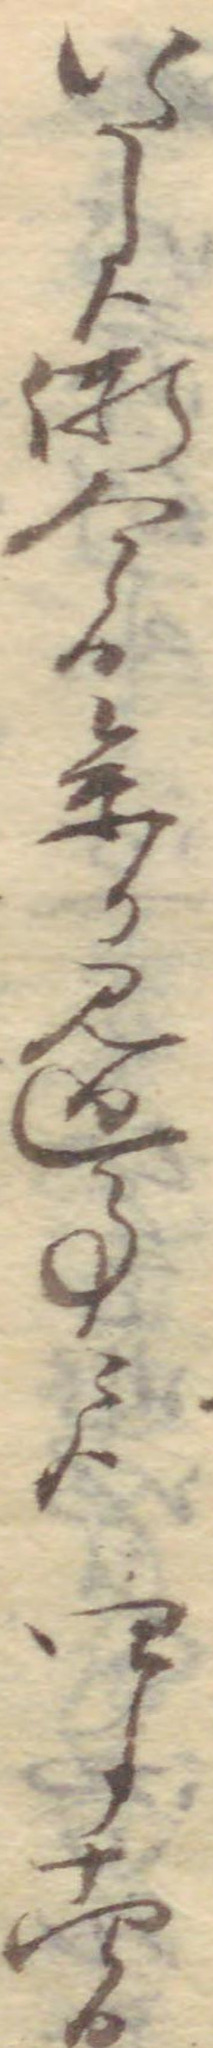いたし候漸今日参り見廻事ニ候四月十四日
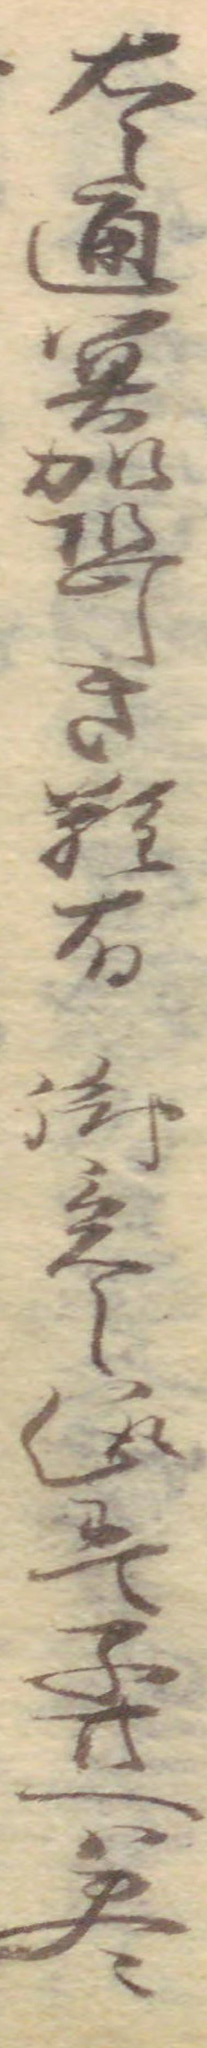右之通冥加恐しき難有御意之趣にて子共へハ夫々
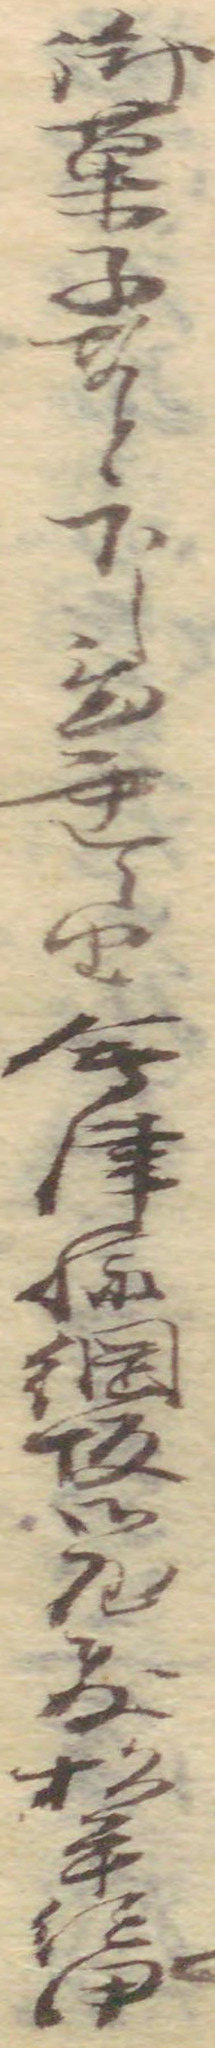御菓子なと下し置れ候由会津様綱坂屋敷松平紀伊
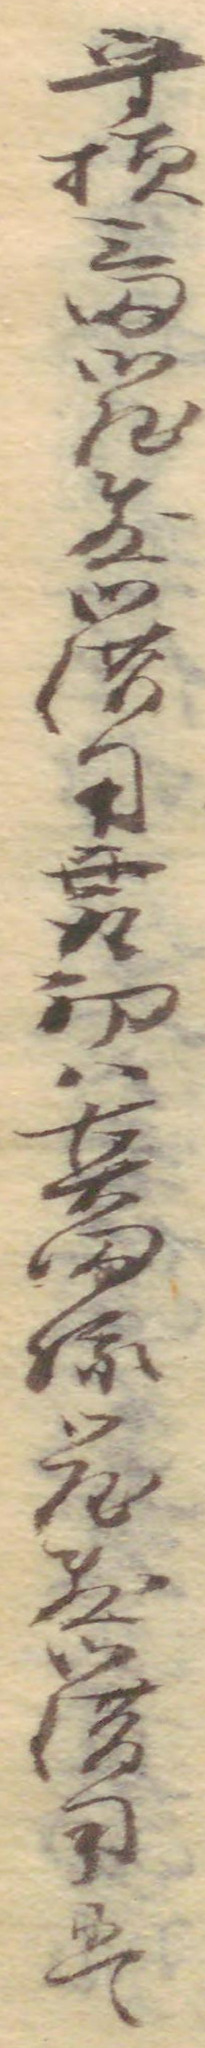守様三田御屋敷御借用最初ハ真田様御屋敷御借用にて

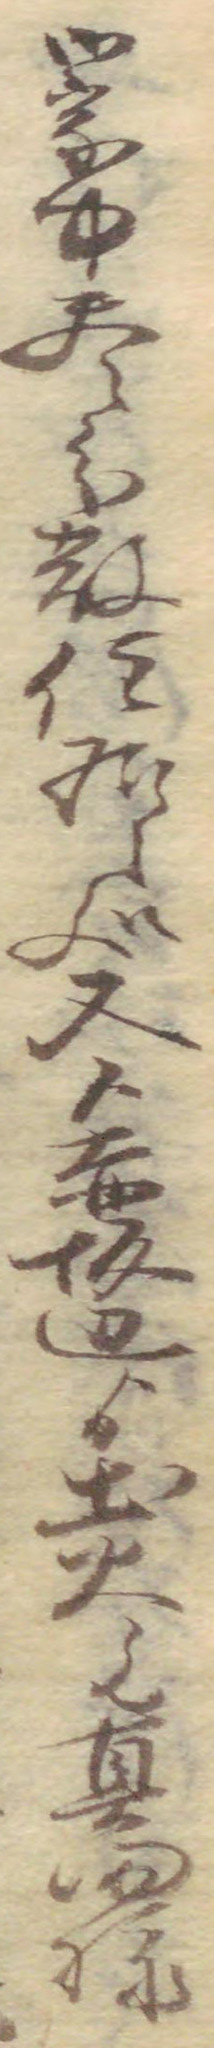御家中夫々分数住居之処又候赤坂辺ゟ出火ニて真田様
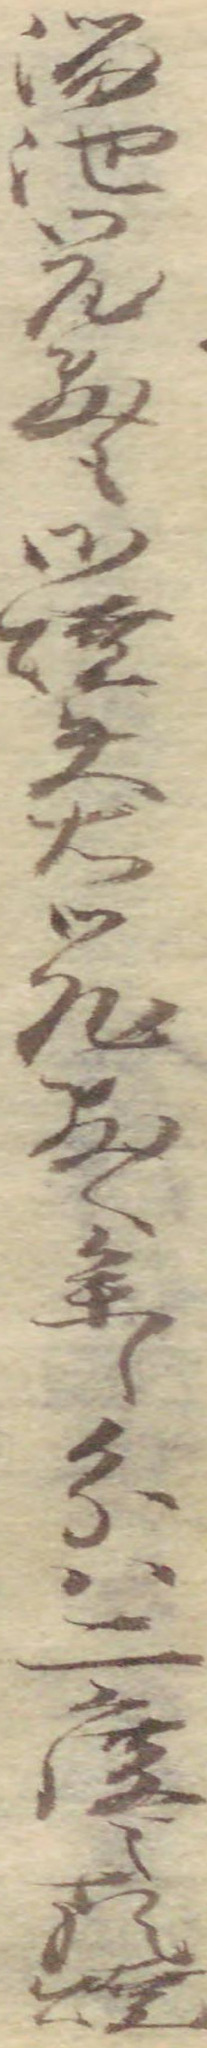溜池御屋敷も御焼失右御屋敷へ参候分ハ二度之類焼
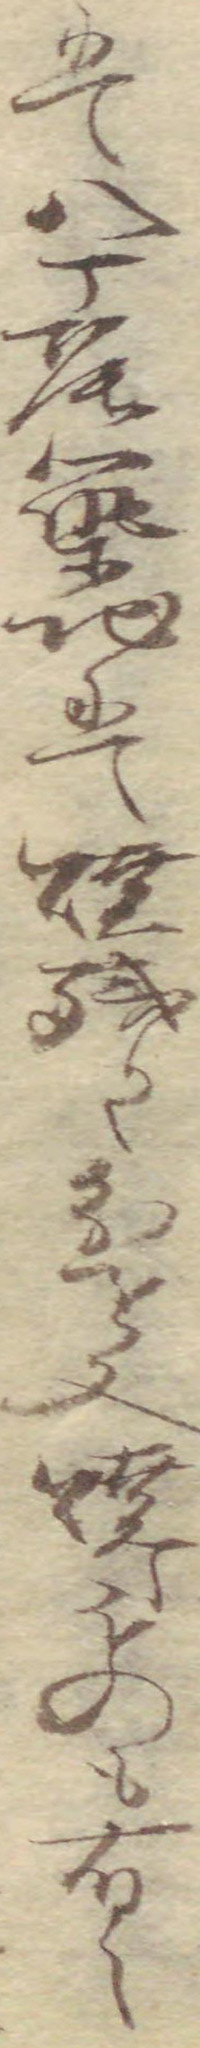にて八丁堀築地にて焼残り候分を又焼候ものも有之
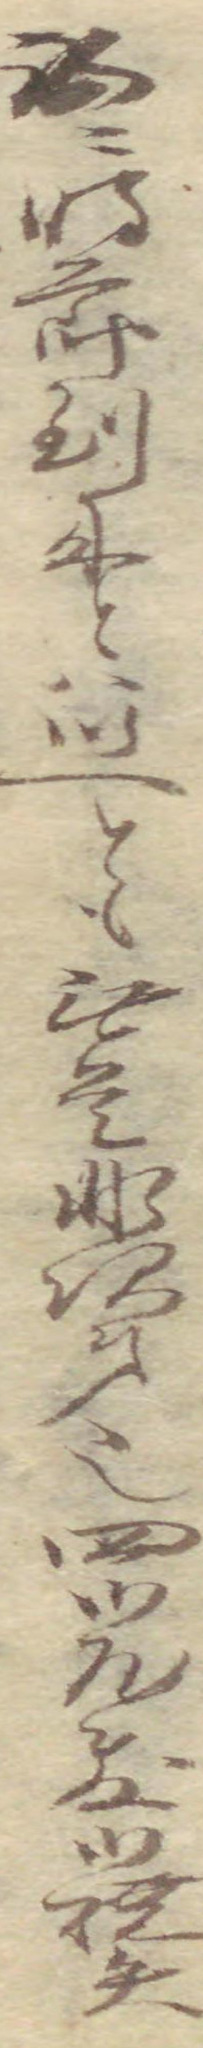誠ニ時節到来とハいへとも無是非次第也四御屋敷御焼失
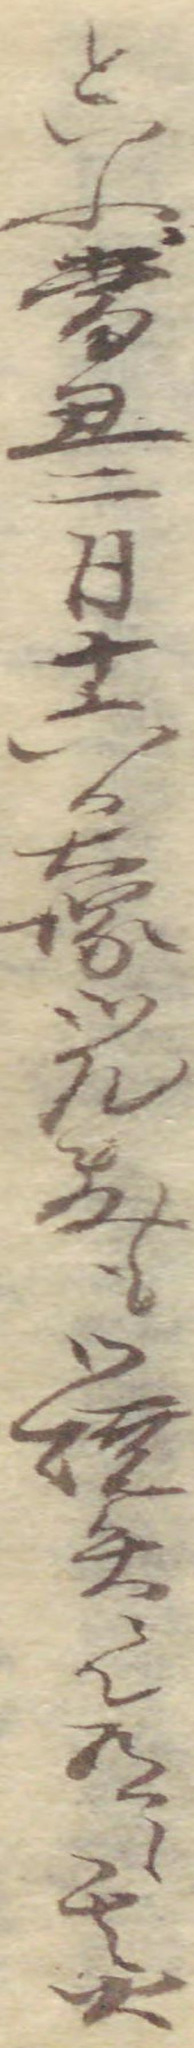といふハ当丑二月十六日大塚御屋敷も御焼失ニて有之其火
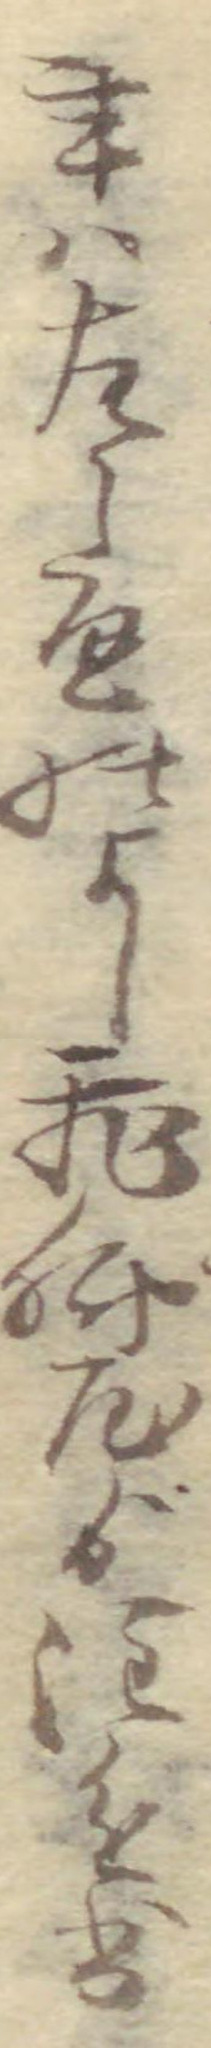事ハ左之通のよし飛脚屋ゟ注進書
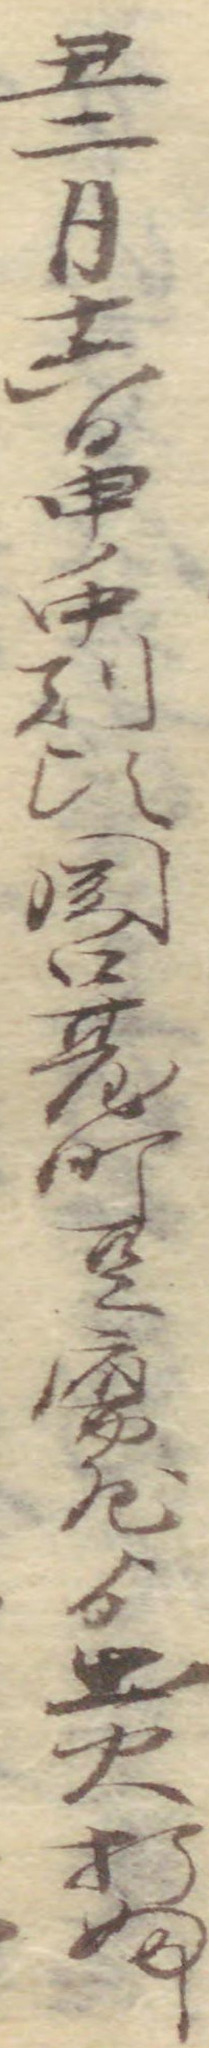丑二月十六日申ノ中刻頃関口台町豆腐屋ゟ出火折ふし
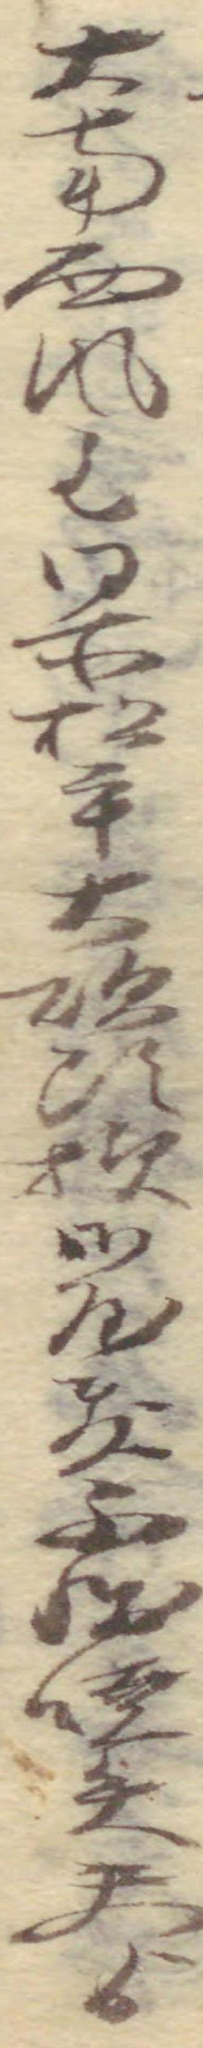大南西風ニて同所松平大炊頭様御屋敷不残焼失夫ゟ
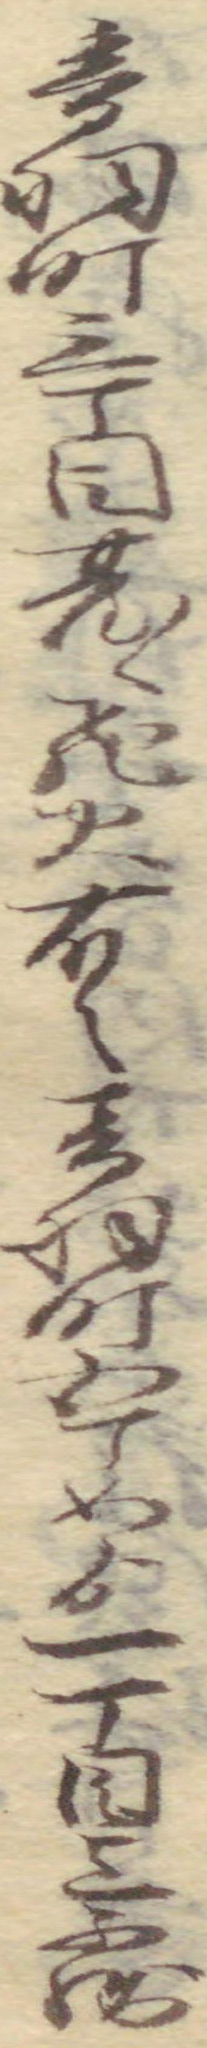音羽町三丁目台へ飛火有之音羽町五丁めゟ一丁目迄不残
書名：鶯宿雑記. 巻199-200
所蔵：国立国会図書館 National Diet Library, JAPAN
